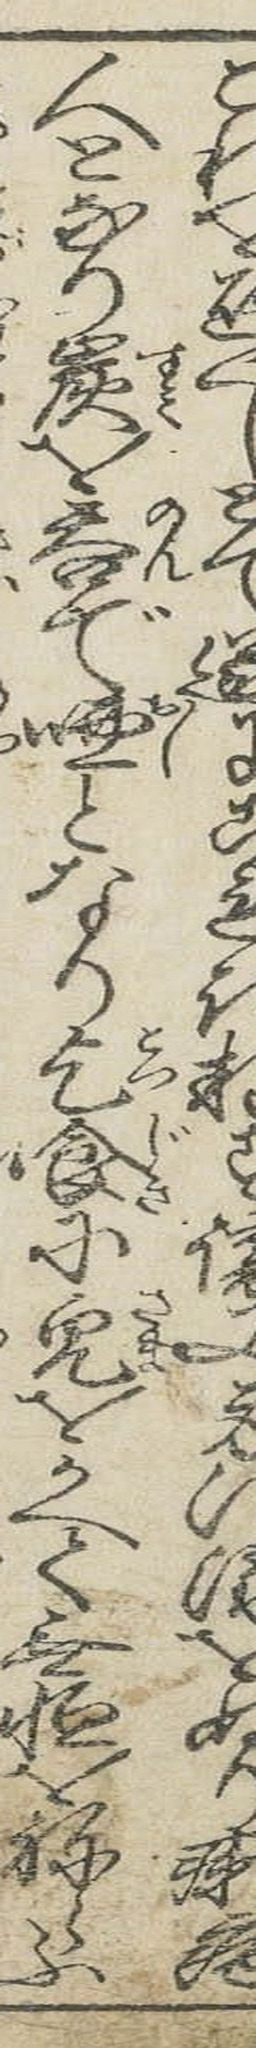人となり炭を呑で啞となり乞食に皃をかへて無恤をねらふ
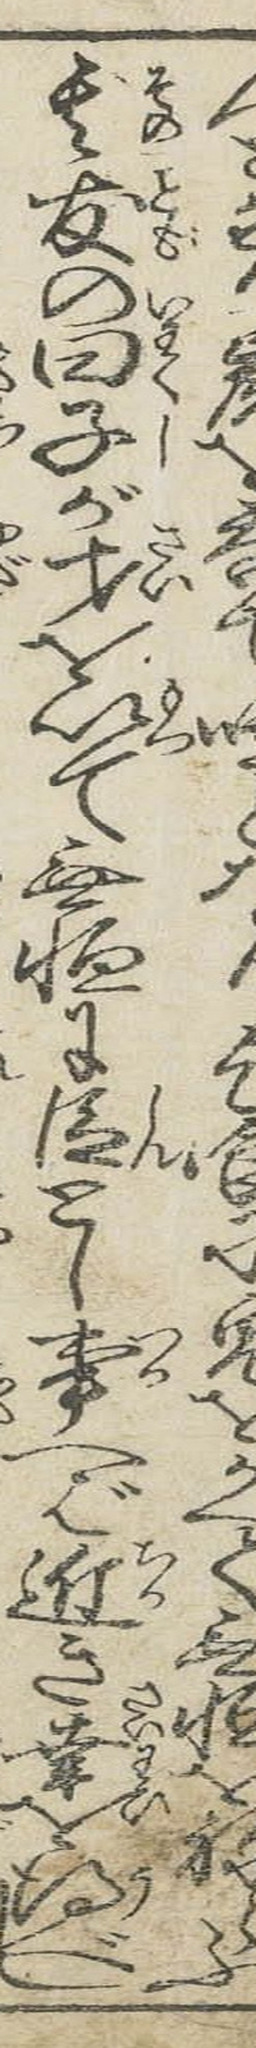其友の曰子が才を以て無恤に臣とし事へば近き幸を得べし
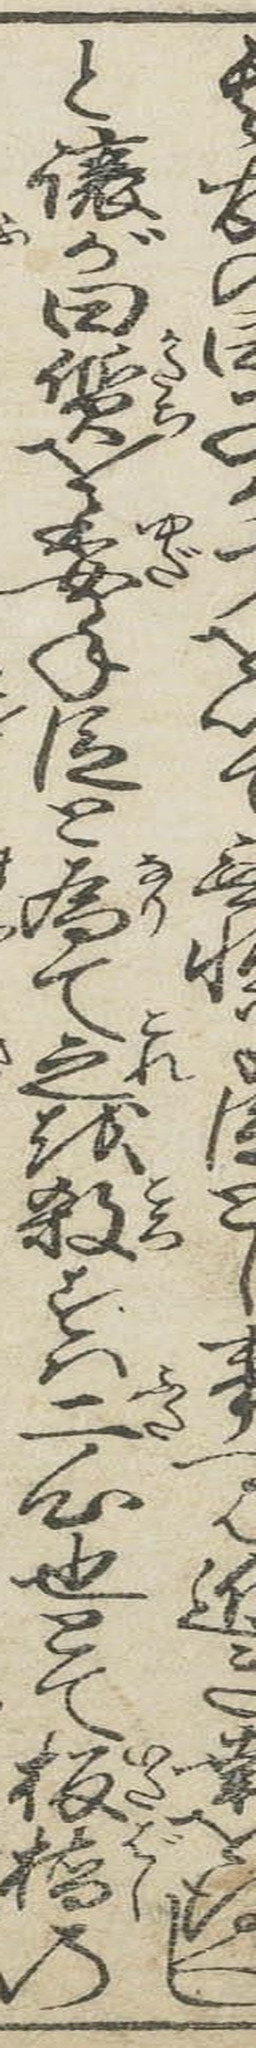と譲が曰質を委ね臣と為て之を殺すは二心也とて板橋の
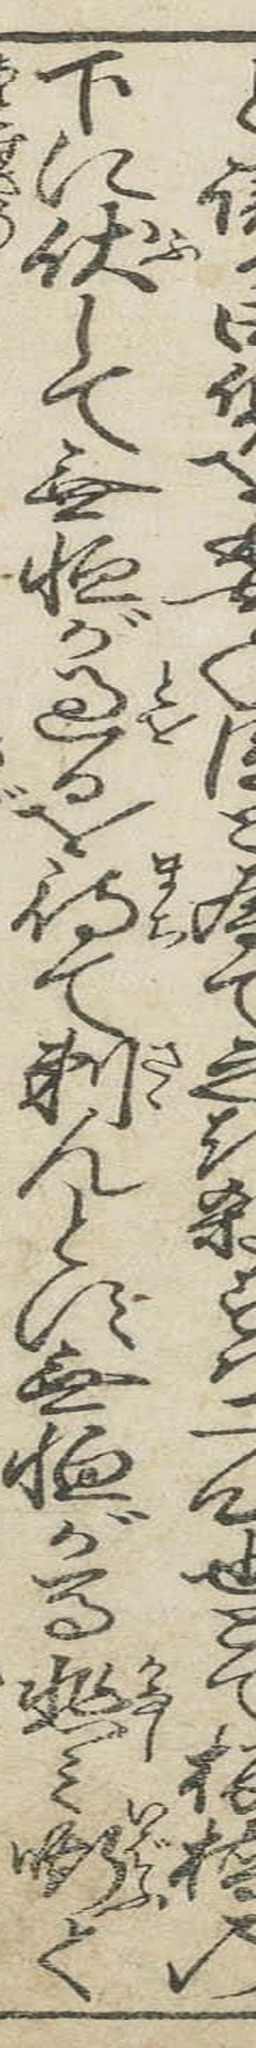下に伏して無恤が過るを待て刺んとす無恤が馬悲み嘶て
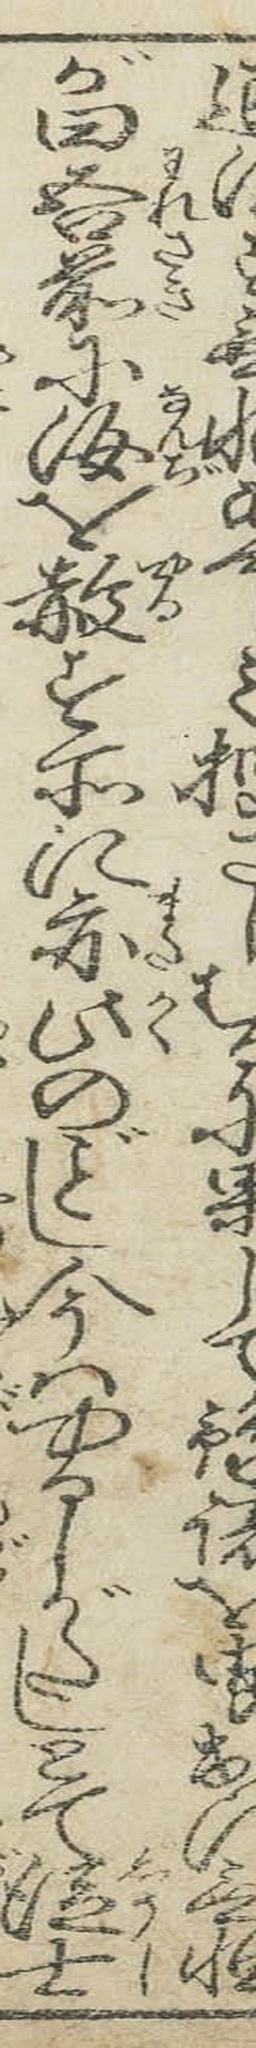が曰吾前に汝を赦す所に亦此のごとし今はゆるしがたしとて従士
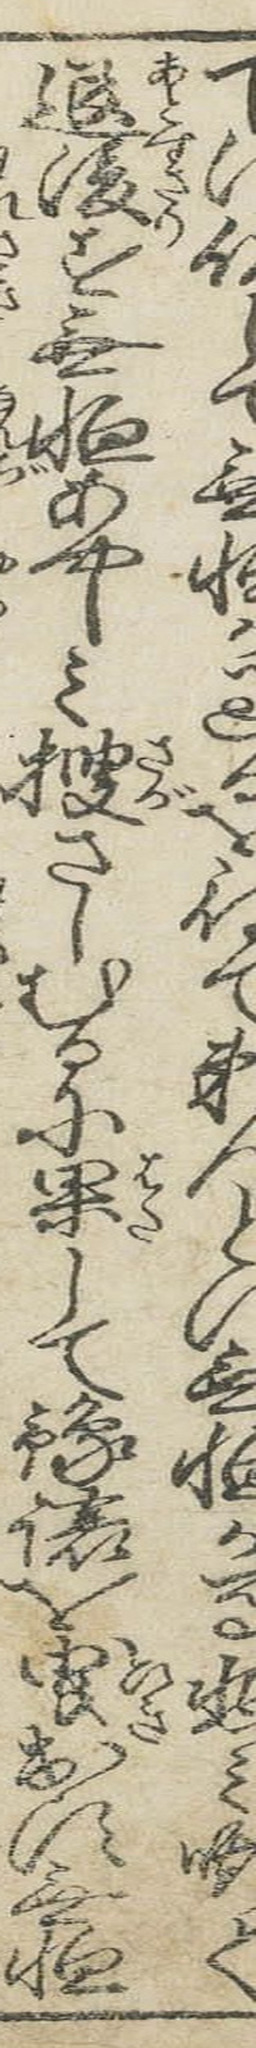退後す無恤あやしみ捜さしむるに果して予譲を曳出す無恤
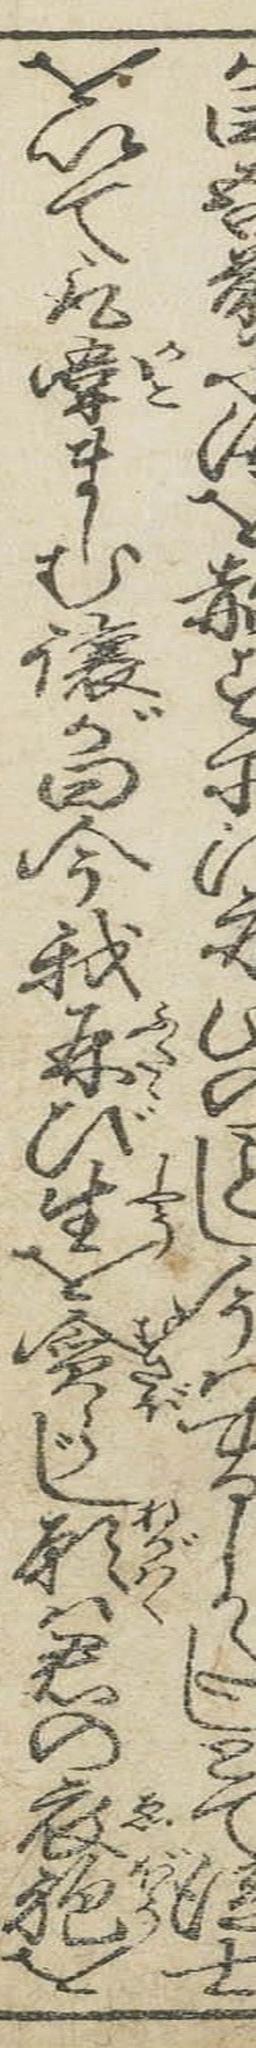を以て取囲ましむ譲が曰今我再び生を貪らじ願は君の衣袍を
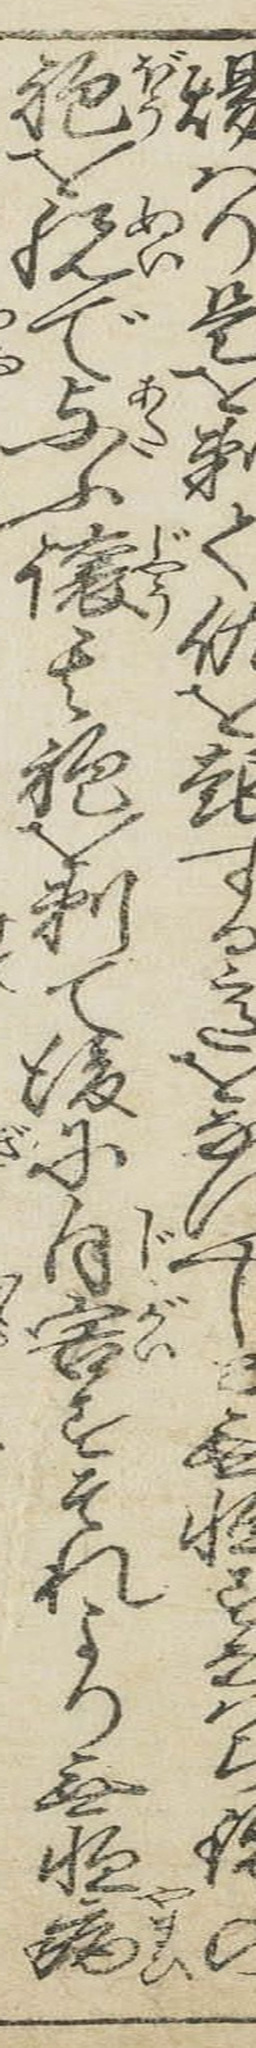袍を脱与ふ譲其袍を刺て後に自害すそれより無恤病
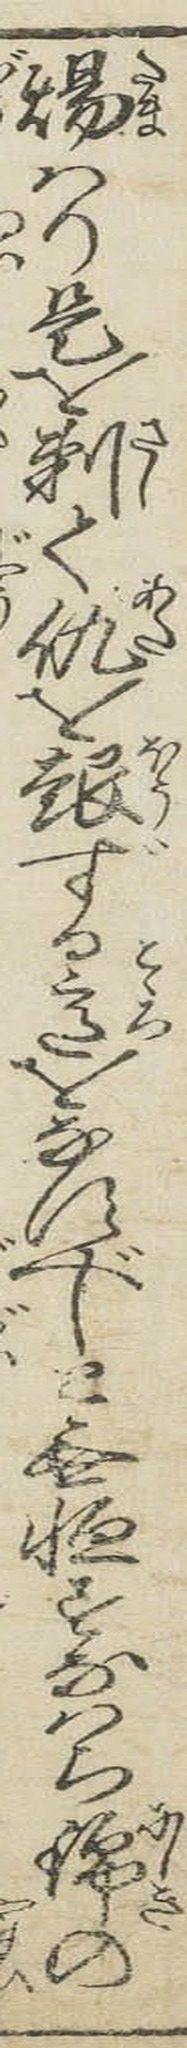賜はり是を刺て仇を報ずる意をなすべしと無恤すなはち錦の
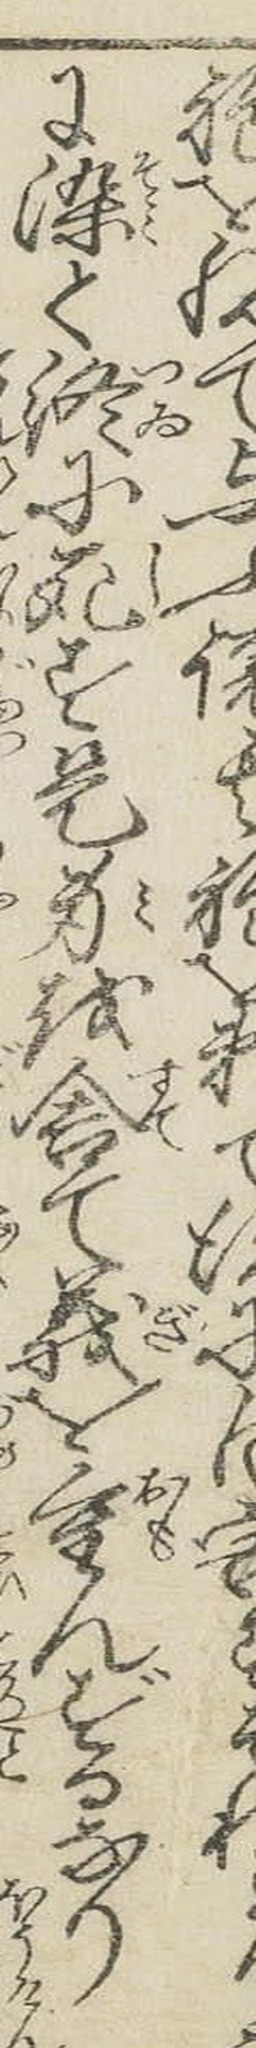に染て終に死す是身を舎義を重んずるなり
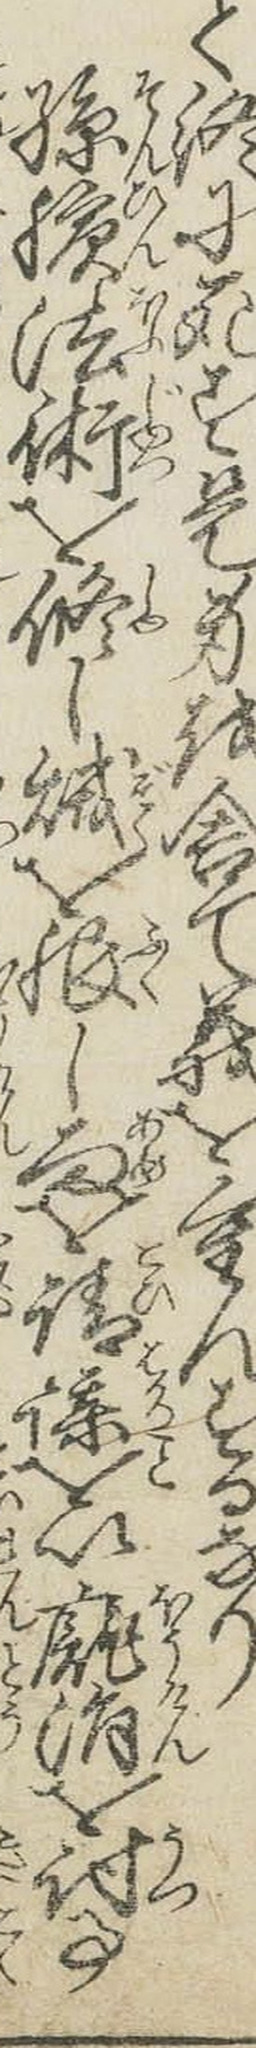孫臏法術を修し賊を服し雨を請謀を以龐涓を討事
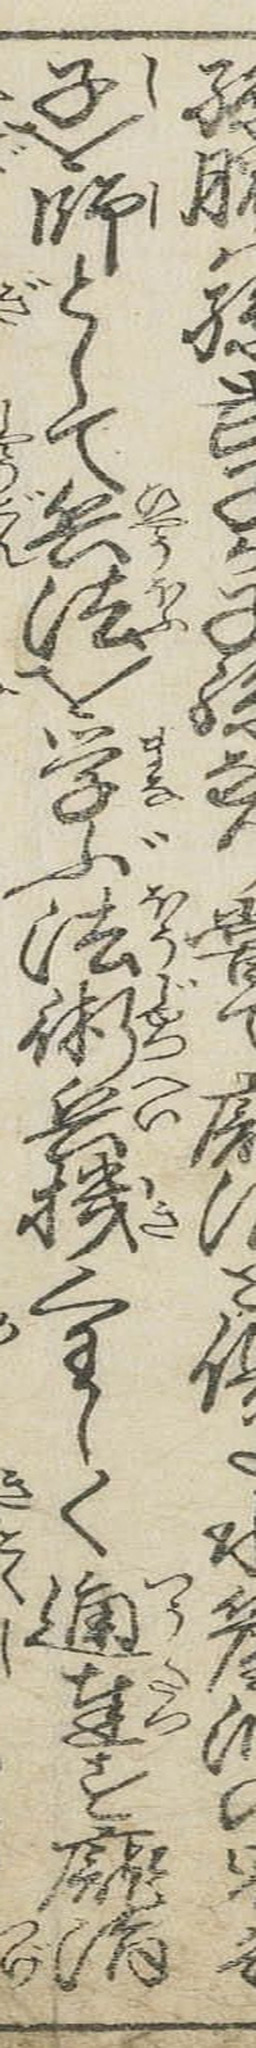子を師として兵法を学ぶ法術兵機くわしく通達す龐涓
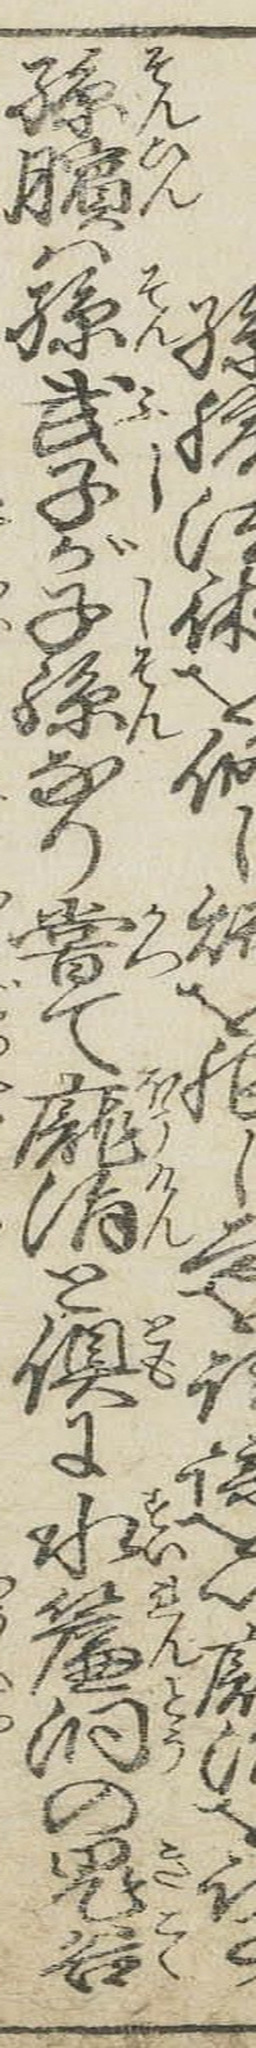孫臏は孫武子が子孫なり嘗て龐涓と倶に水簾洞の鬼谷
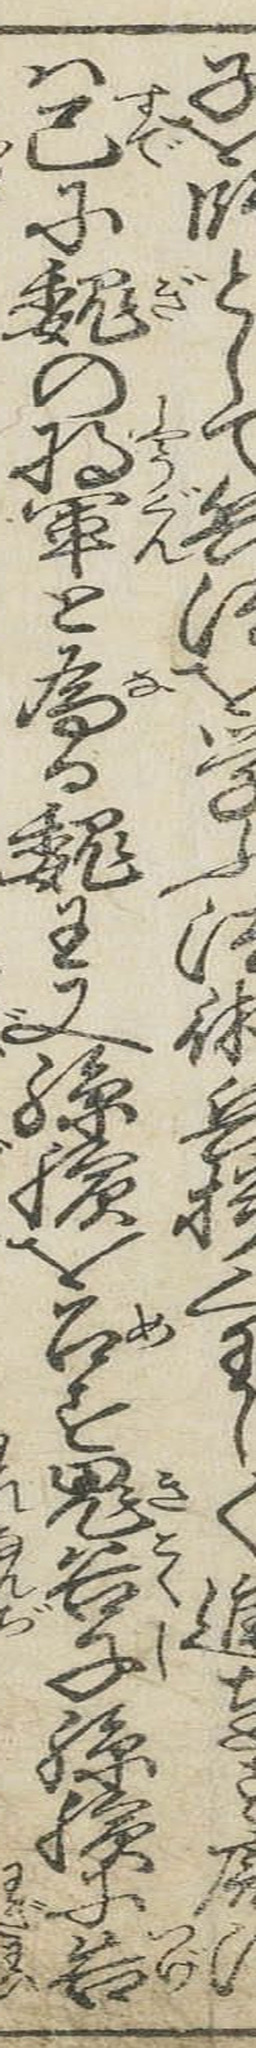は已に魏の将軍と為る魏王又孫臏を召す鬼谷子孫臏に告
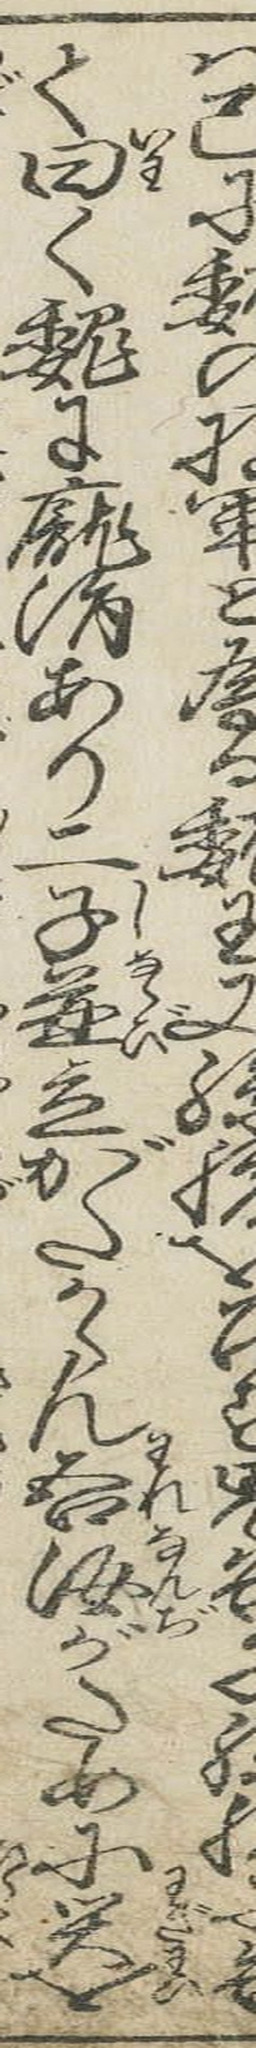て曰く巍に龐涓あり二子並立がたからん吾汝がために災を
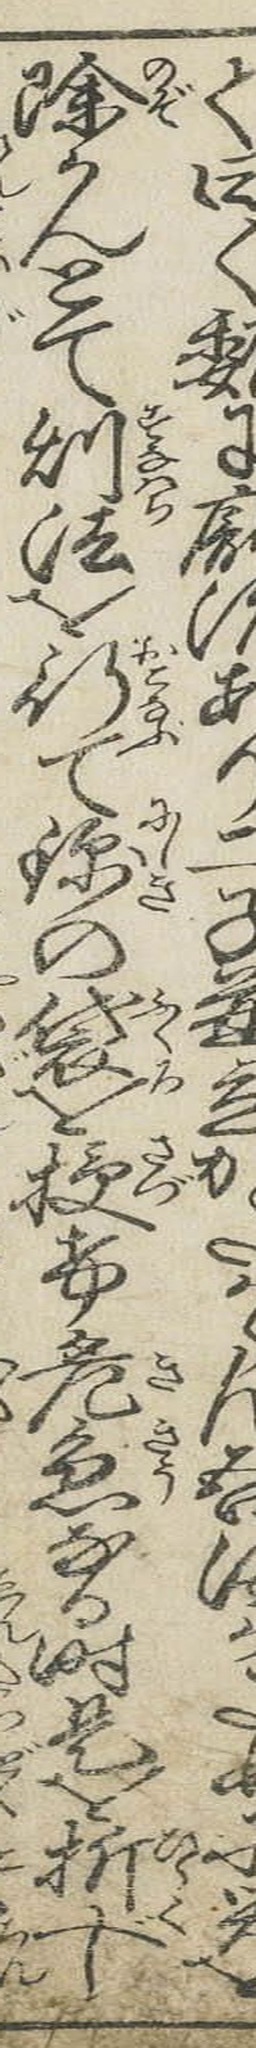除かんとて則法を行て錦の袋を授け危急なる時是を折べし
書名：絵本写宝袋 9巻 6之巻
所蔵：東京学芸大学教育コンテンツアーカイブ
